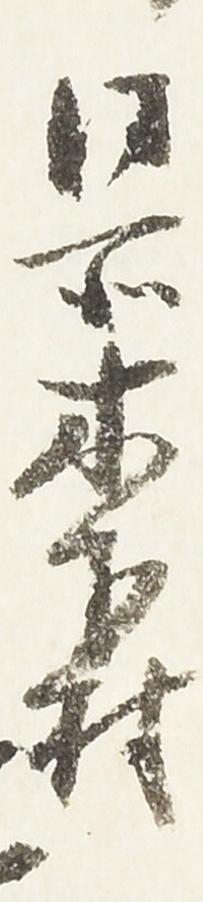同所木下村
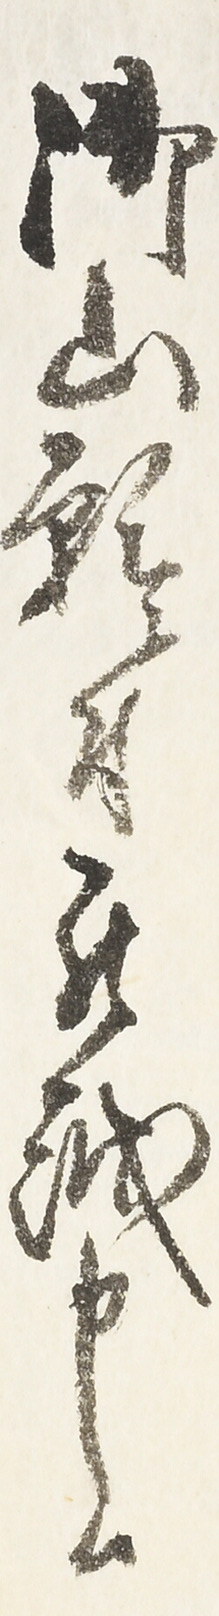御山願ニ付罷越申候
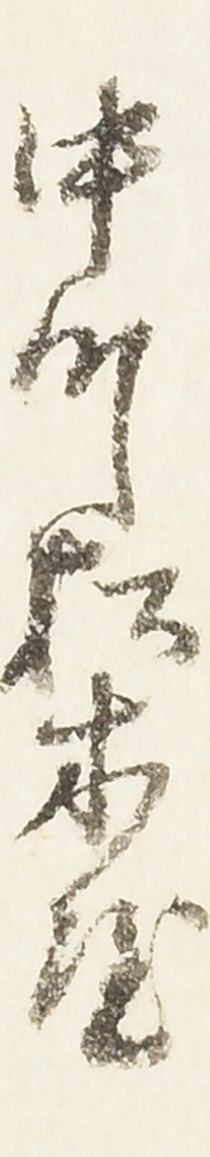中町松木屋
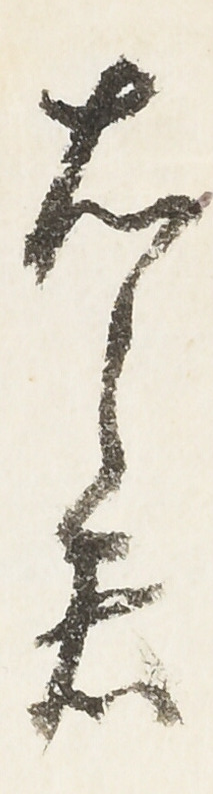右之者
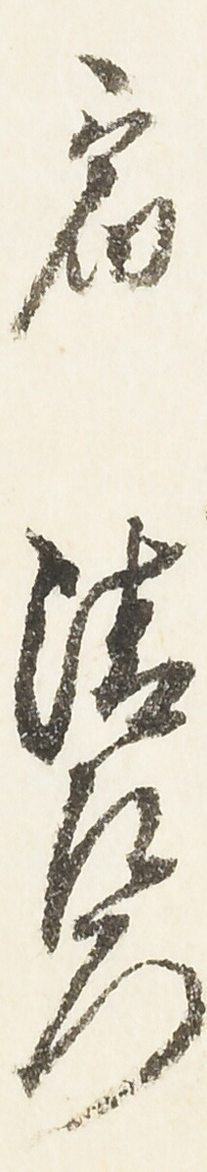宿清左衛門
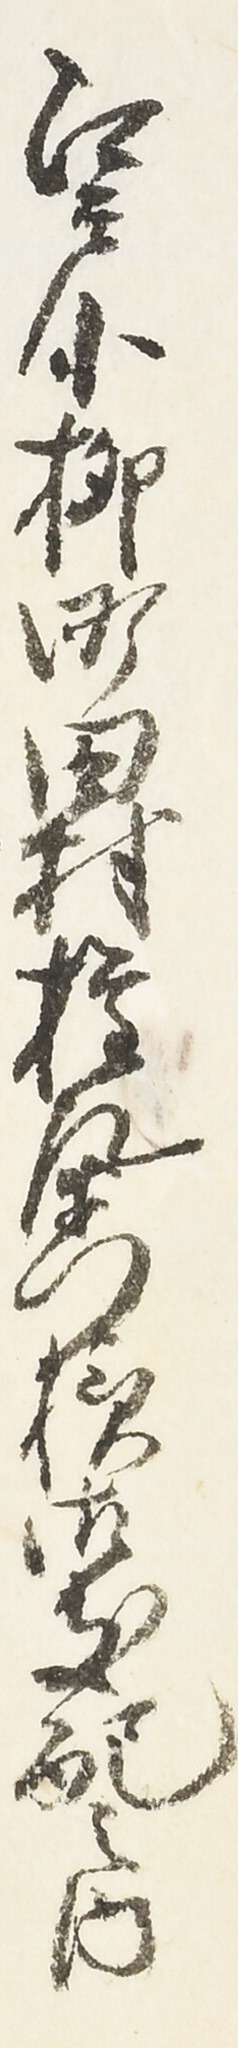江戸小柳町田村権左衛門様御支配之内
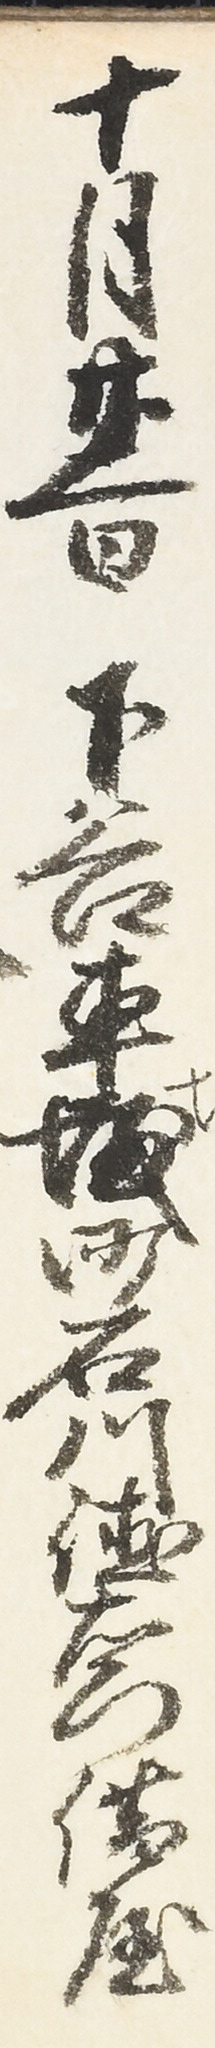十月廿一日下谷車坂町石川徳右衛門借屋
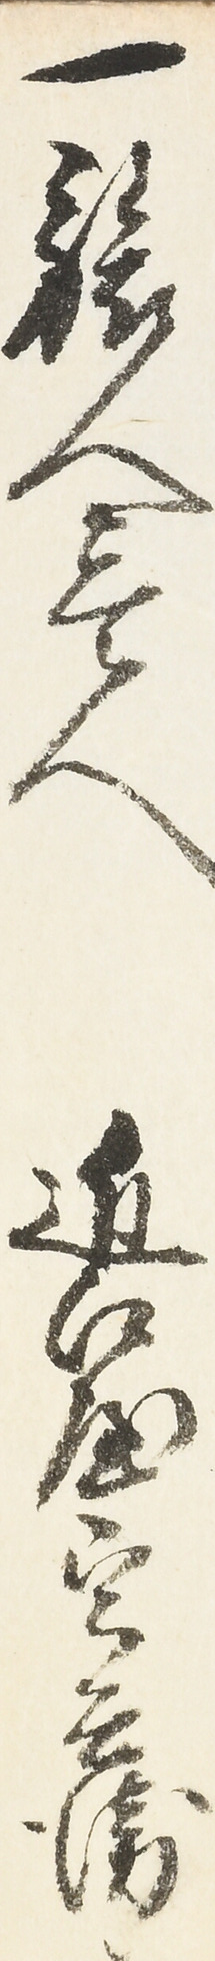一旅人壱人近江屋宇兵衛・
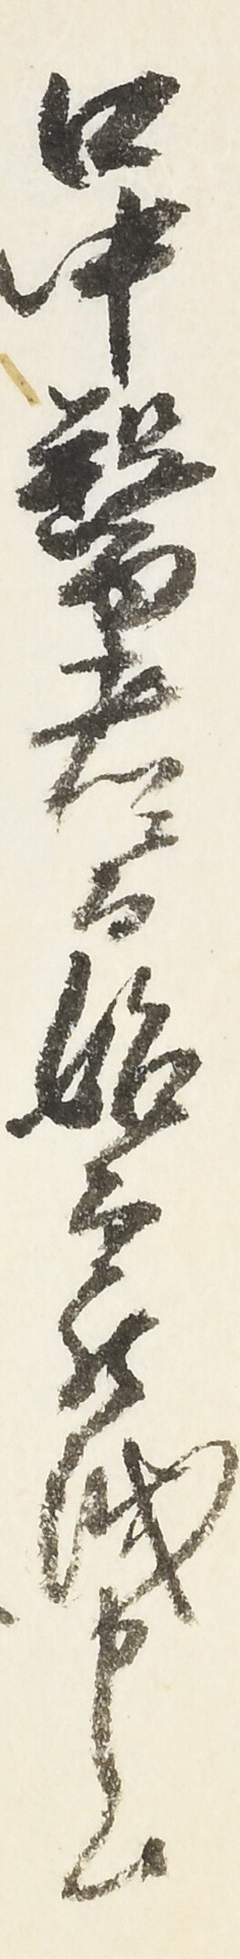口中医者ニ而始而罷越申候
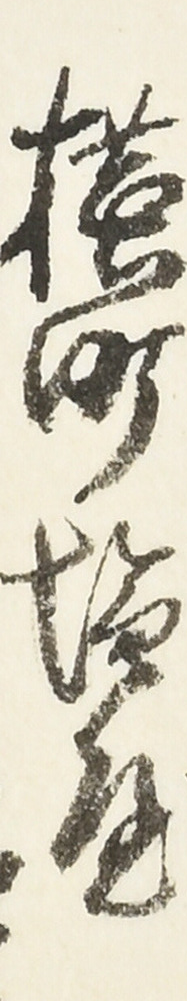横町塩屋
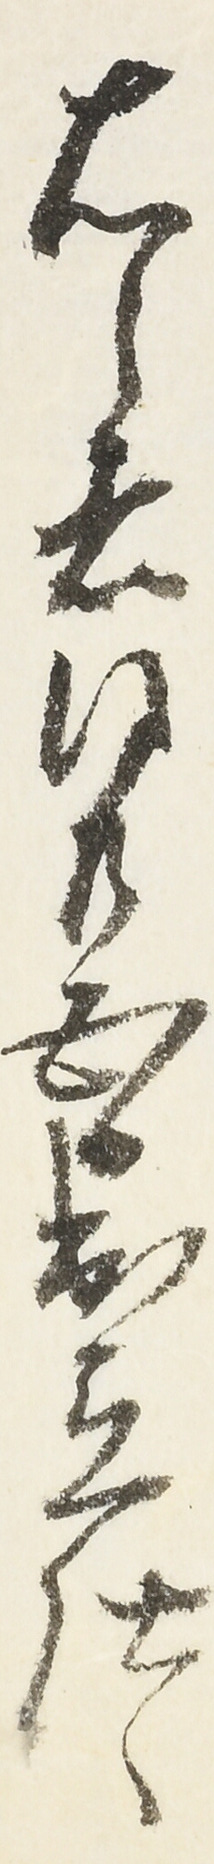右之者同廿五日出立仕候
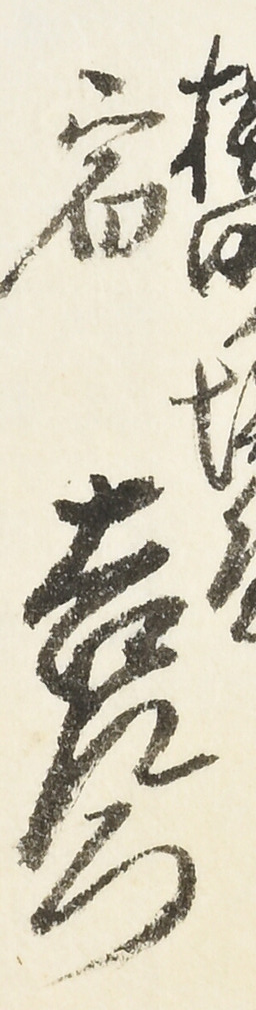宿吉左衛門

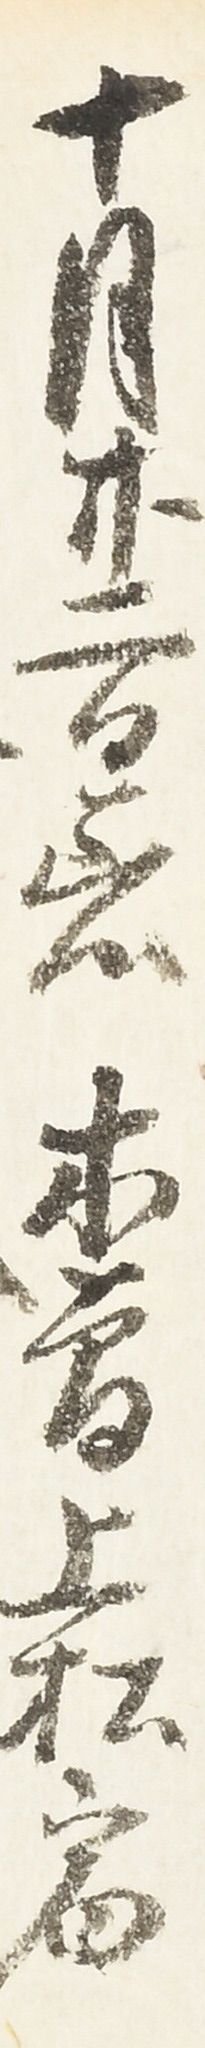十月廿二日着木曽上松宿
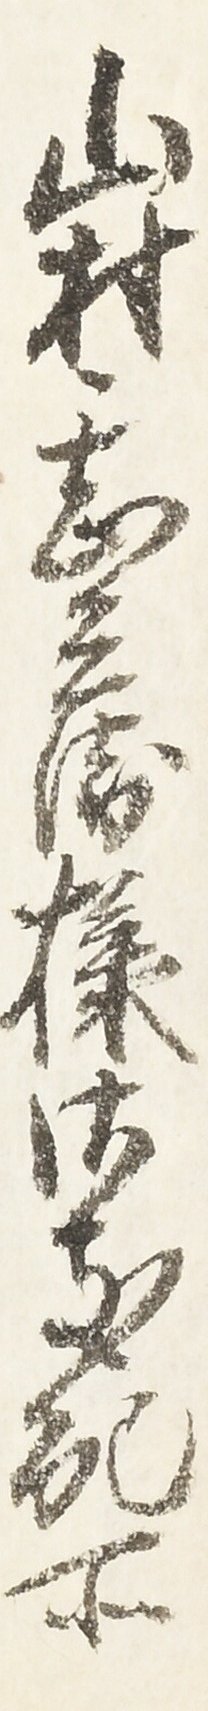山村甚兵衛様御支配所
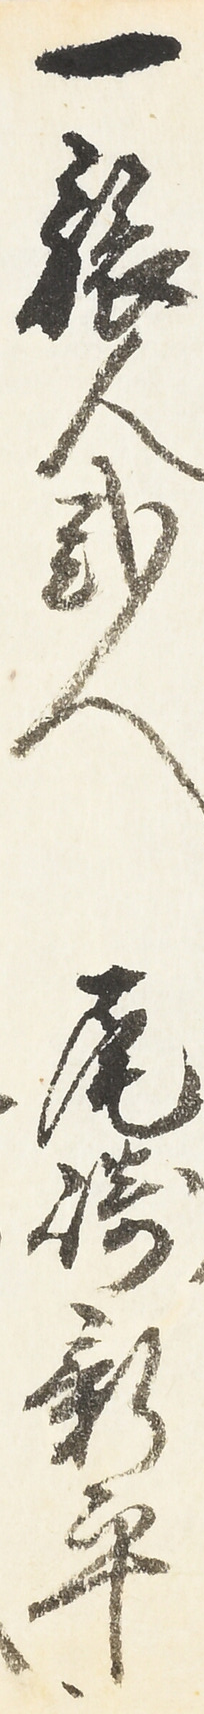一旅人弐人尾崎新平・
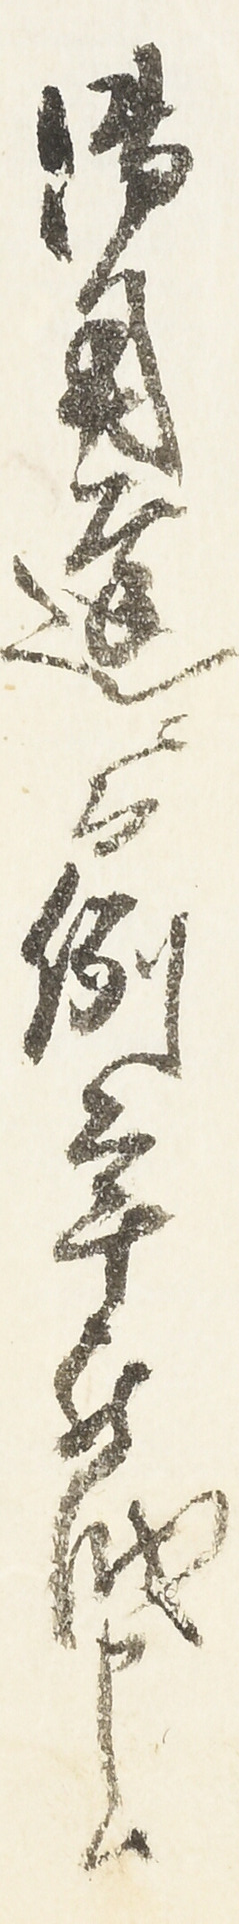御用達ニ而例年罷越申候
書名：町中旅人泊控帳
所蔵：伊那市立高遠町図書館・合同会社AMANE
